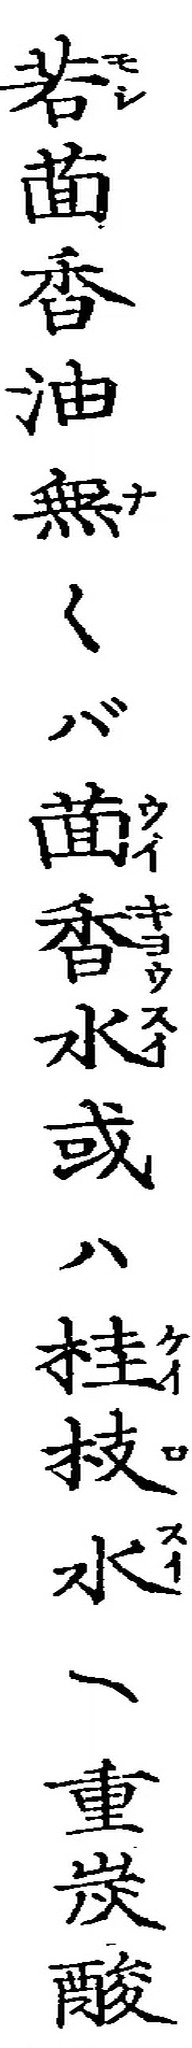若茴香油無くば茴香水或は桂枝水へ重炭酸
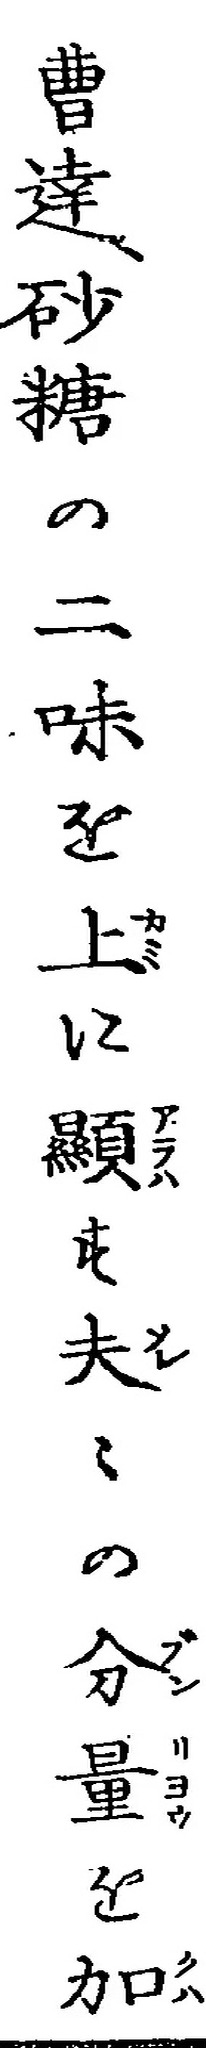曹達、砂糖の二味を上顕す夫々の分量を加
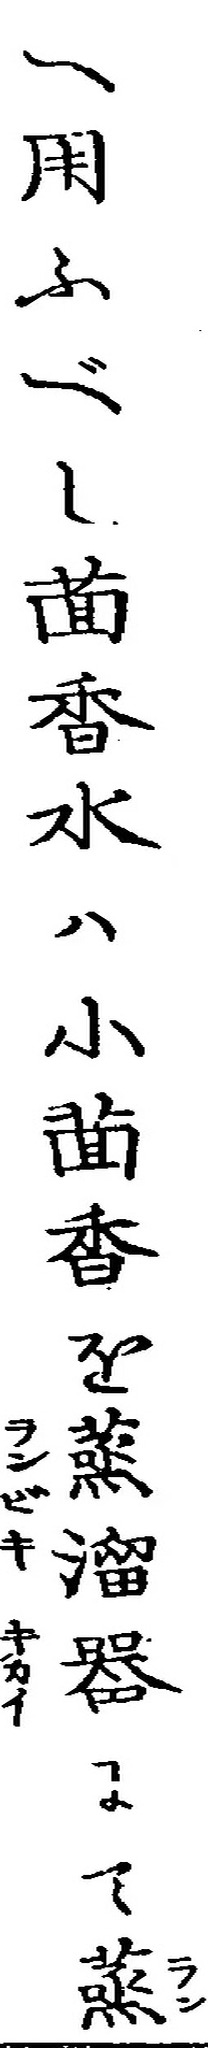へ用ふべし茴香水は小茴香を蒸溜器にて蒸
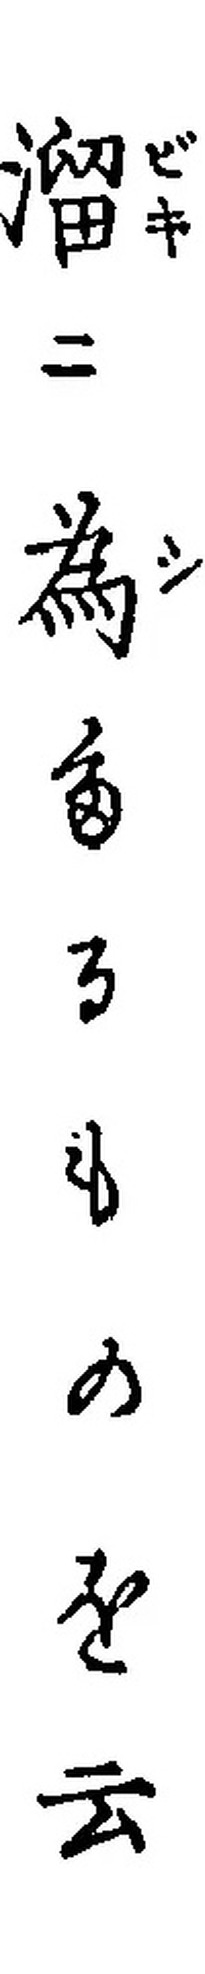溜に為たるものを云
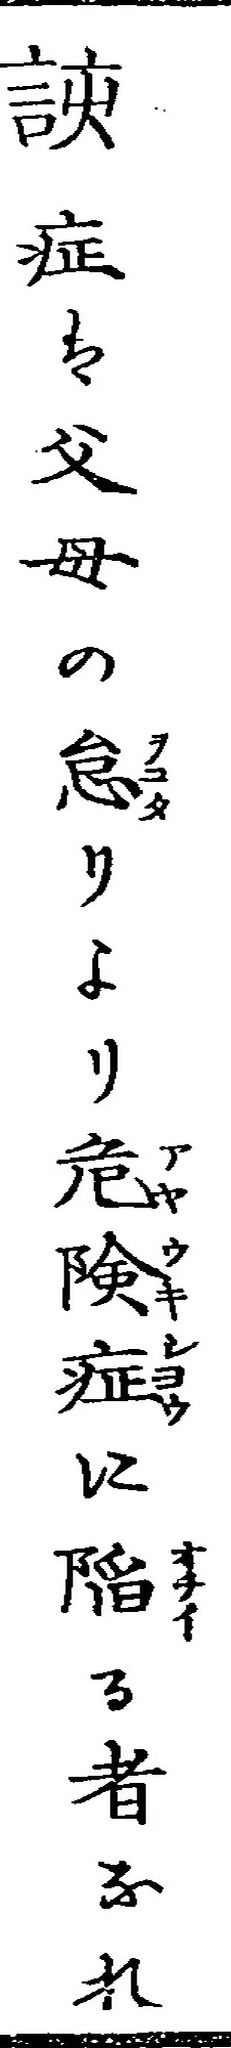該症は父母の怠りより危険症に陥る者なれ
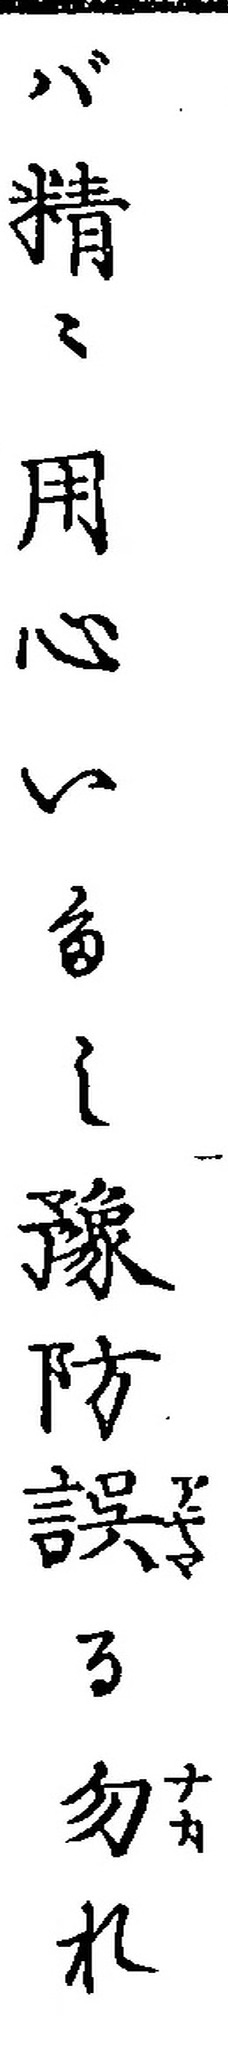ば精々用心いたし予防誤る勿れ
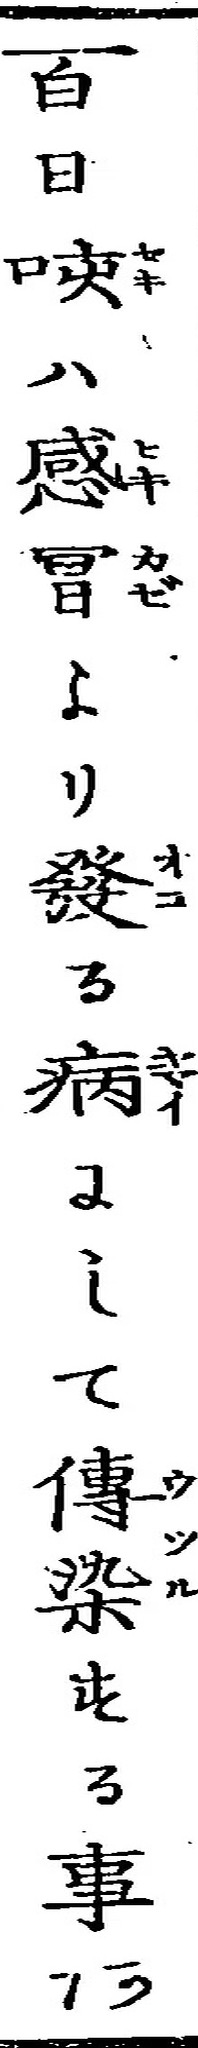百日咳は感冒より発る病にして伝染する事あ
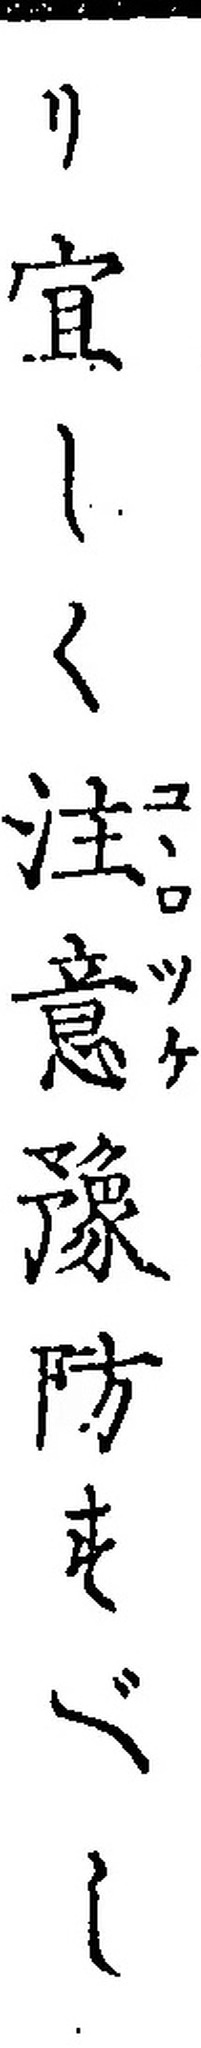り宜しく注意予防すべし
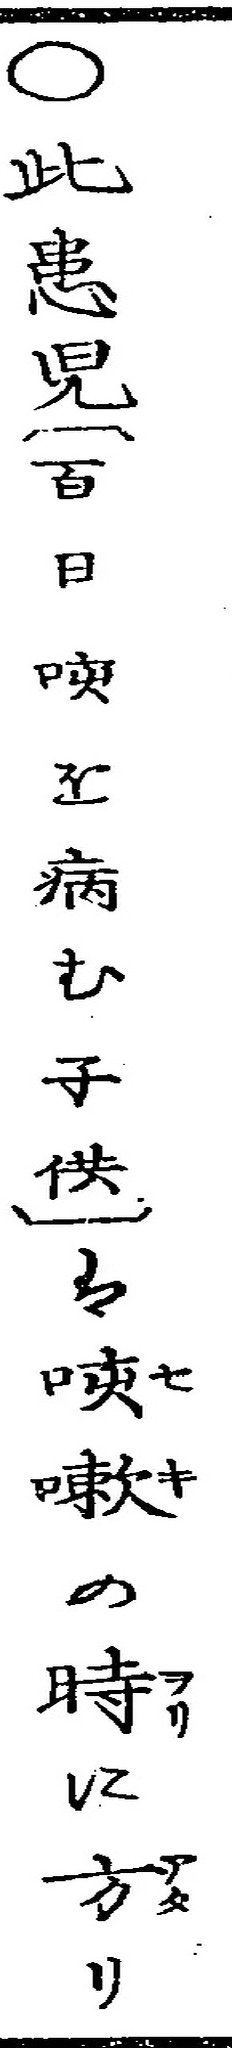○此患児[百日咳を病む子供]は咳嗽の時に方り
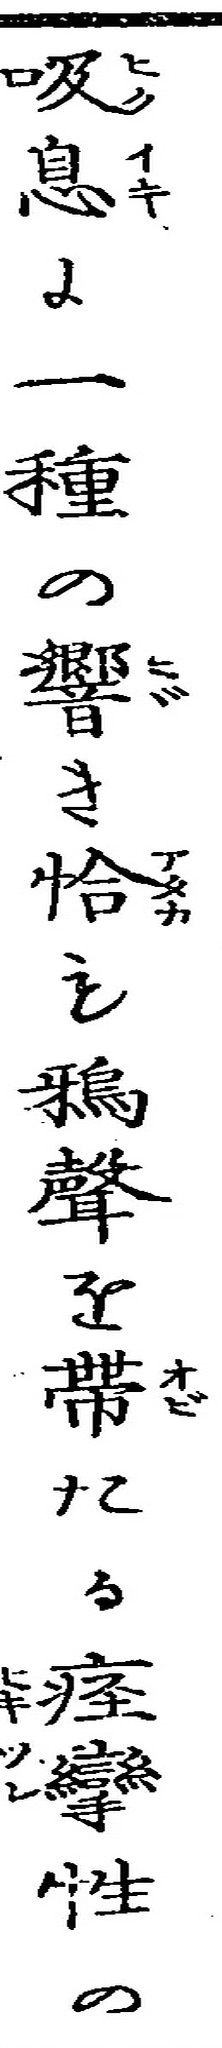吸息に一種の響き恰も鴉声を帯たる痙攣性の
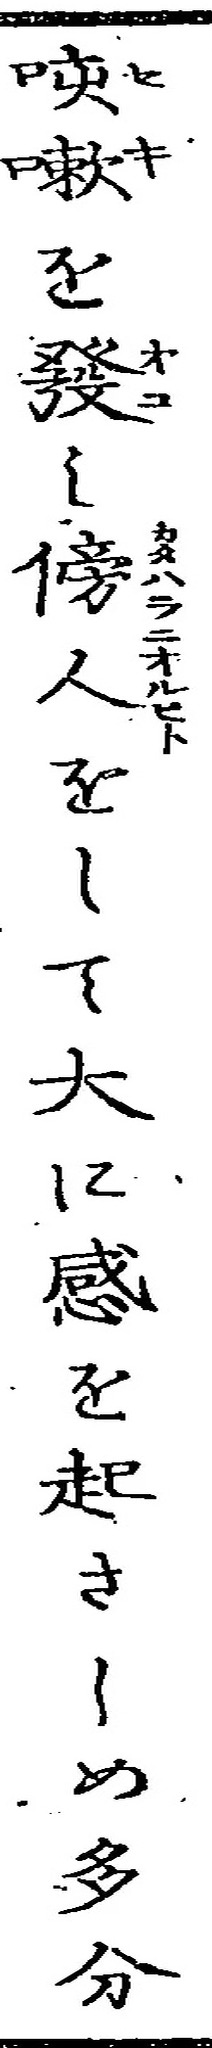咳嗽を発し傍人をして大に感を起さしめ多分
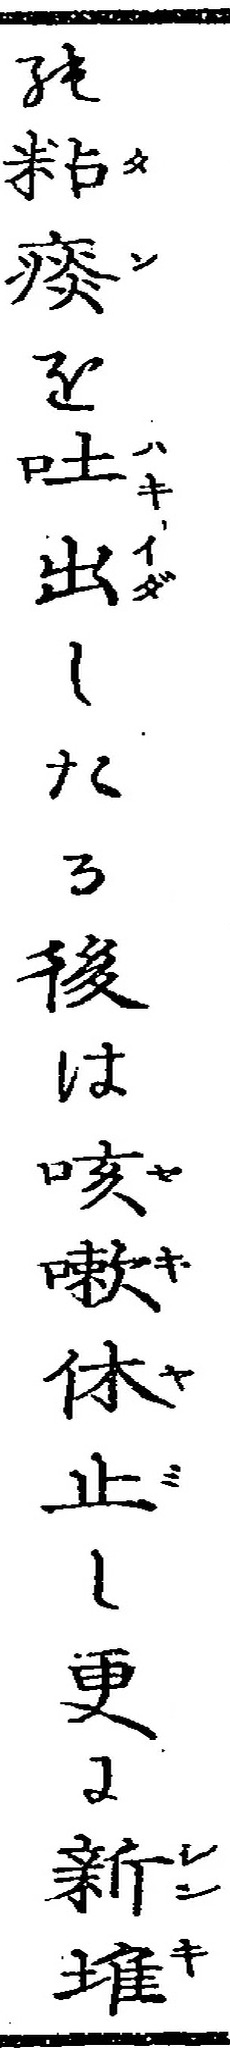の粘痰を吐出したる後は咳嗽休止し更に新堆
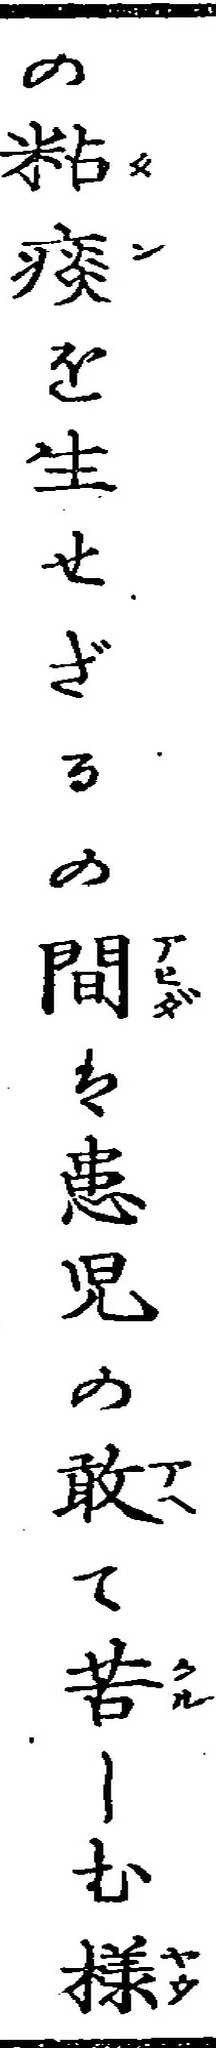の粘痰を生せざるの間は患児の敢て苦しむ様
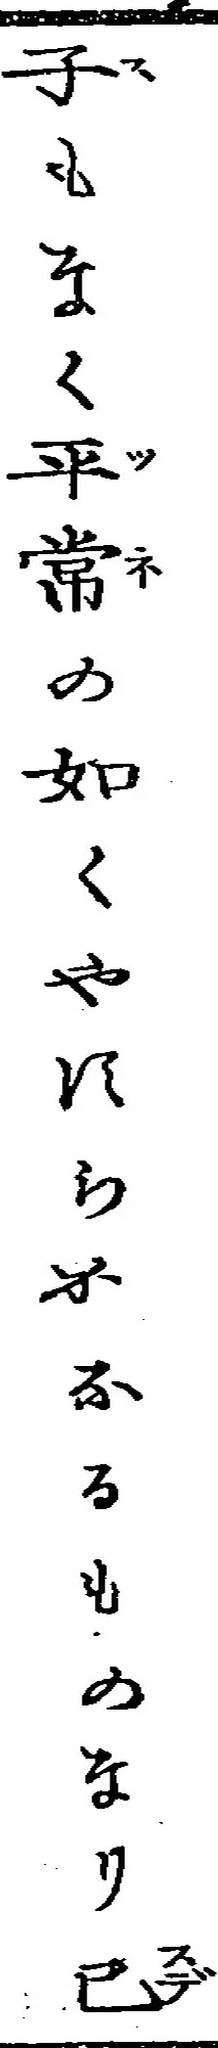子もなく平常の如くやすらかなるものなり已
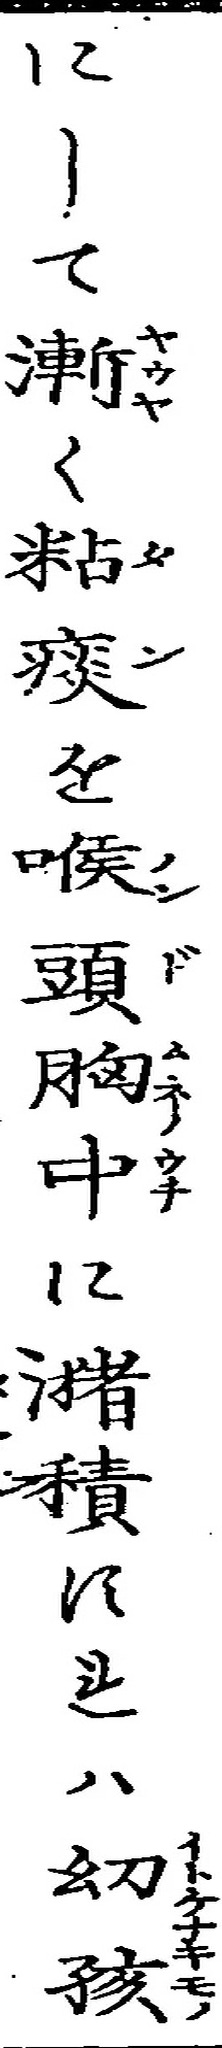にして漸く粘痰を喉頭胸中に潴積すれは幼孩

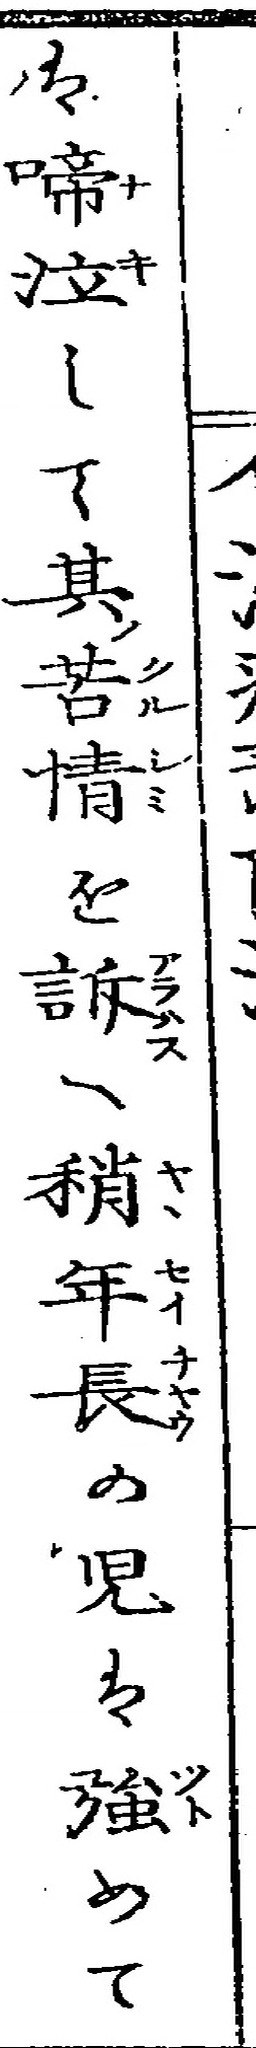は啼泣して其ノ苦情を訴へ稍年長の児は強めて
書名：伝染病予防法
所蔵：国立国会図書館 National Diet Library, JAPAN
